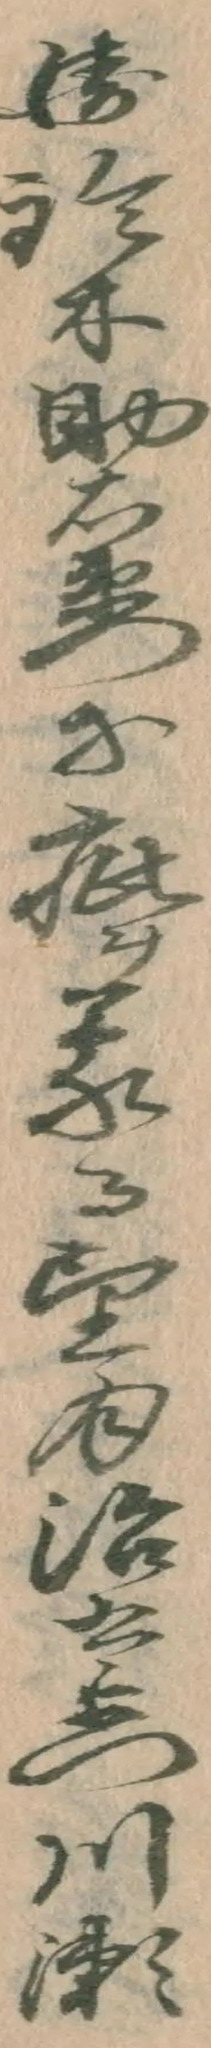衛鈴木助右衛門等疵を蒙る望月治右衛門川瀬
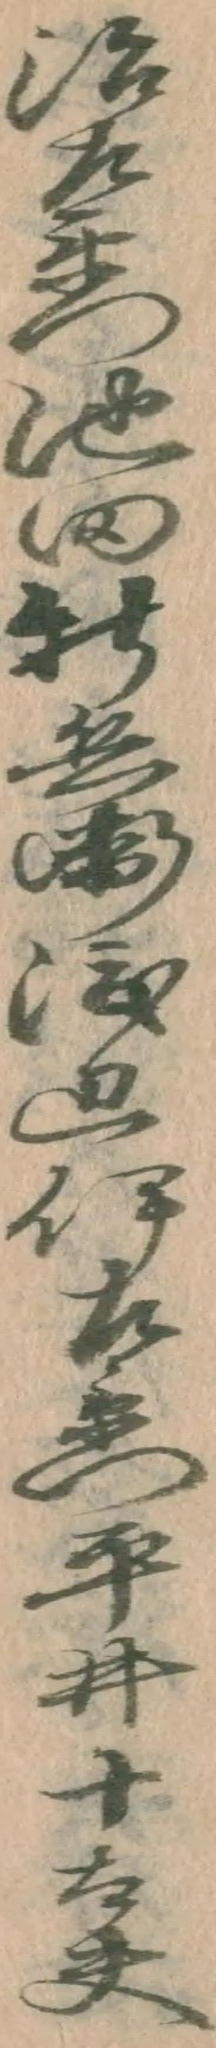治左衛門池田新兵衛渡辺伊左衛門平井十太夫
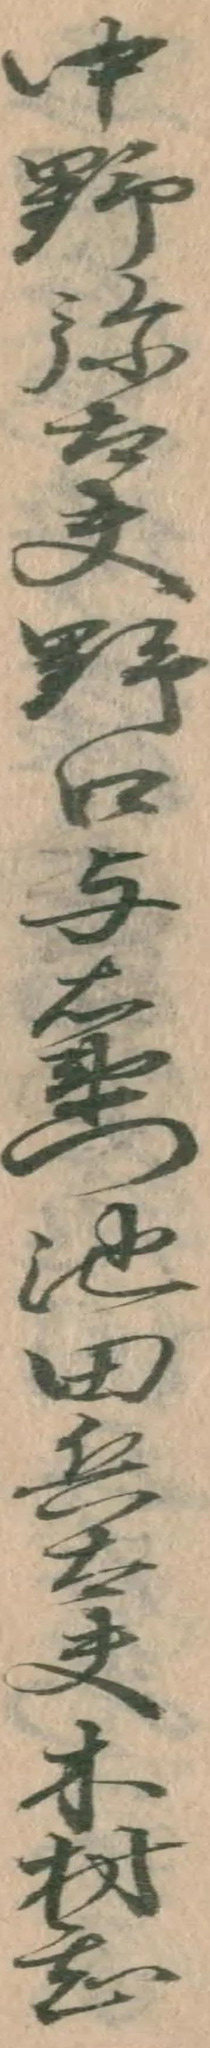中野弥太夫野口与右衛門池田兵太夫木村甚
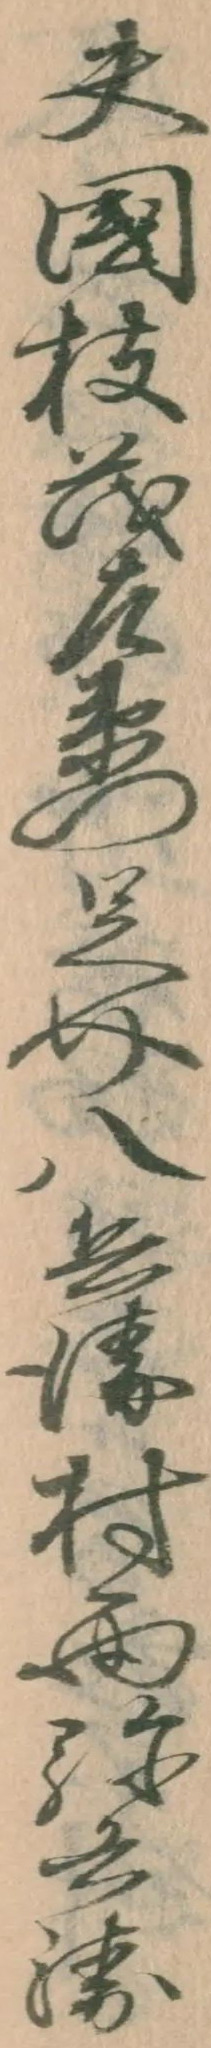夫国枝茂左衛門足介八兵衛村雨弥兵衛
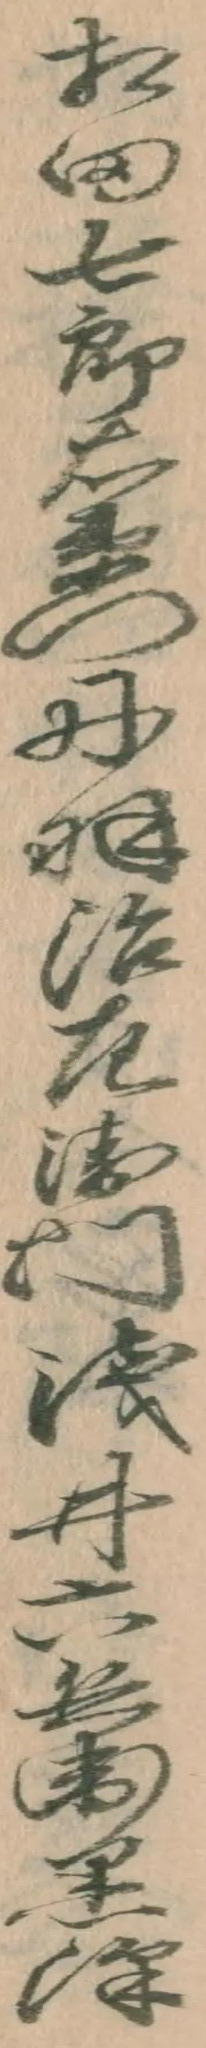相田七郎右衛門丹羽治左衛門浅井六兵衛黒沢
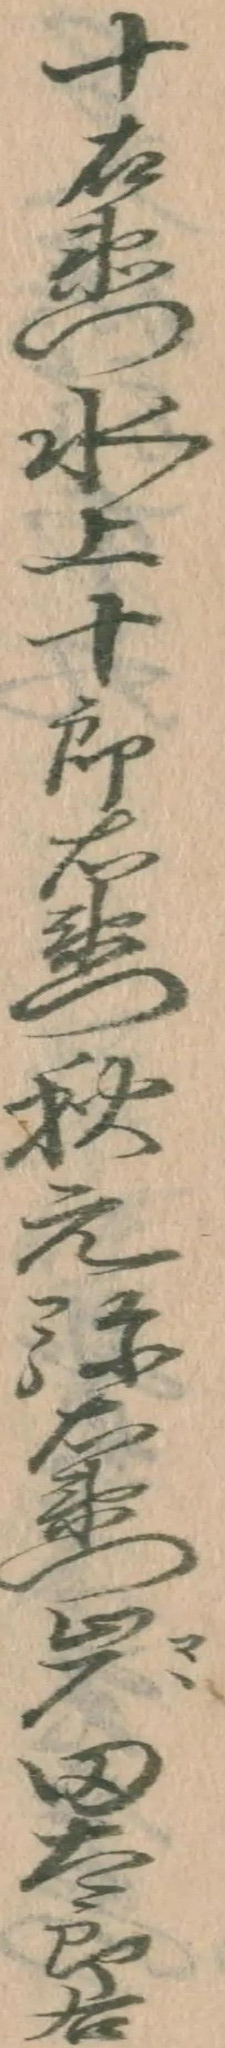十右衛門水上十郎右衛門秋元弥右衛門岩田太郎右
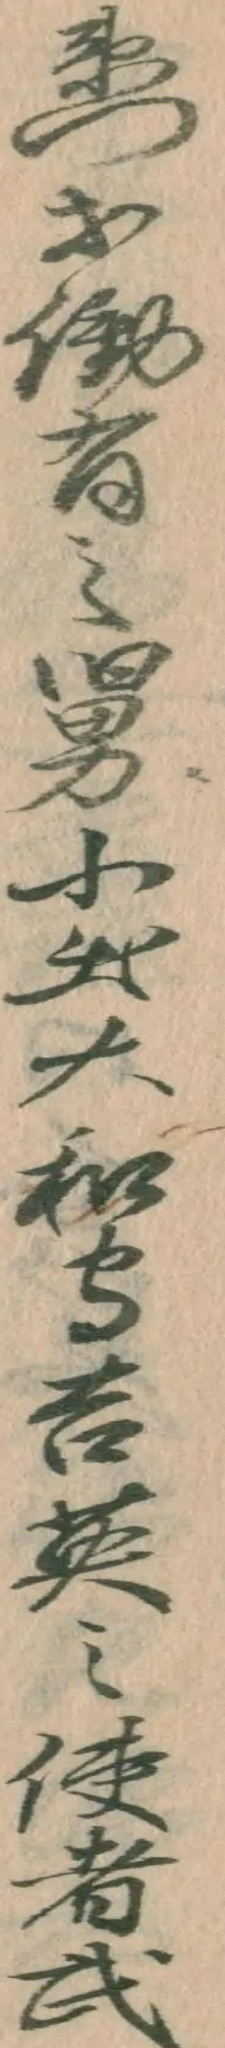衛門等働有之旧男小出大和守吉英之使者武
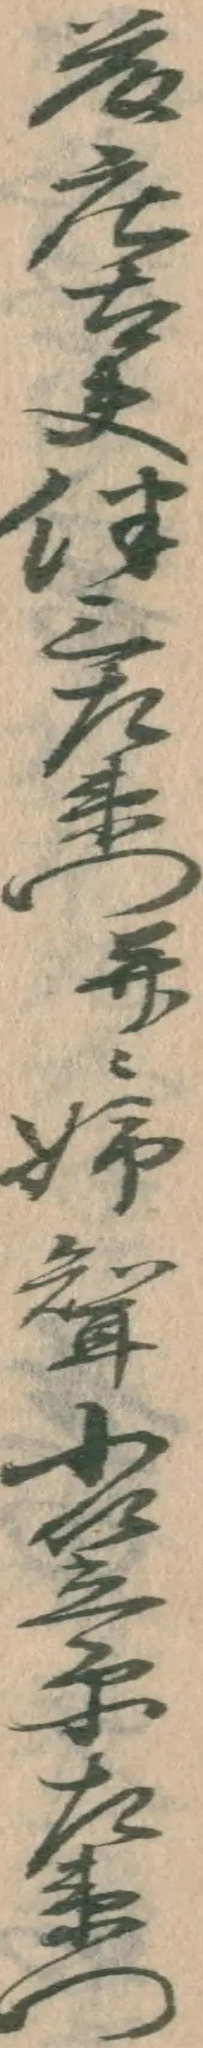藤庄太夫伴三左衛門幷に姉聟小笠原左衛門
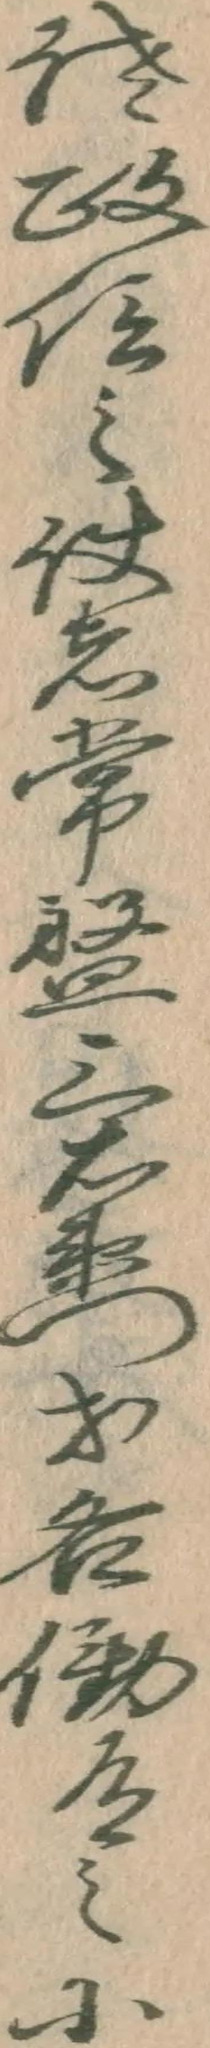佐政信之使者常盤三右衛門等各働有之小
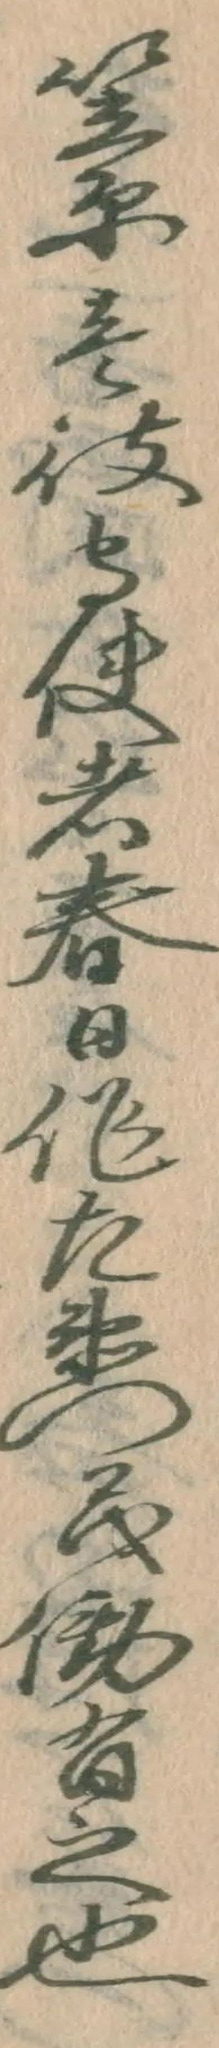笠原壱岐守使者春日作左衛門茂働有之也
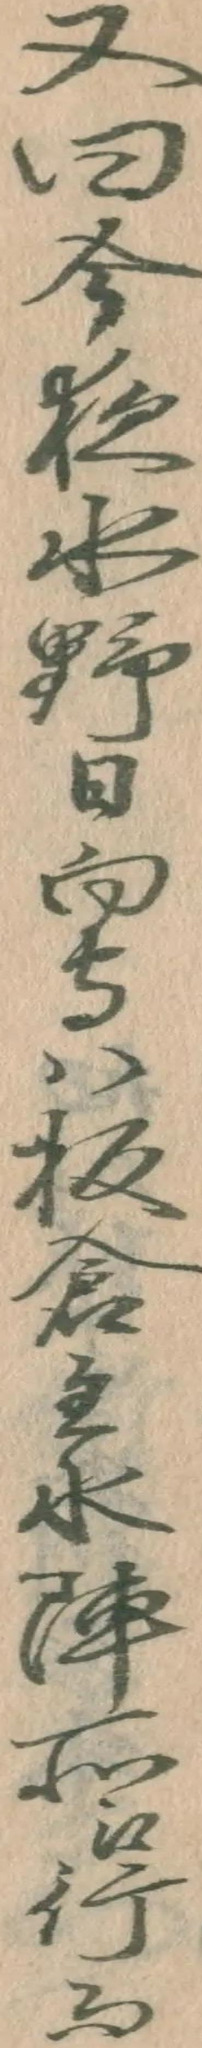又曰今夜水野日向守は板倉主水陣所江行而
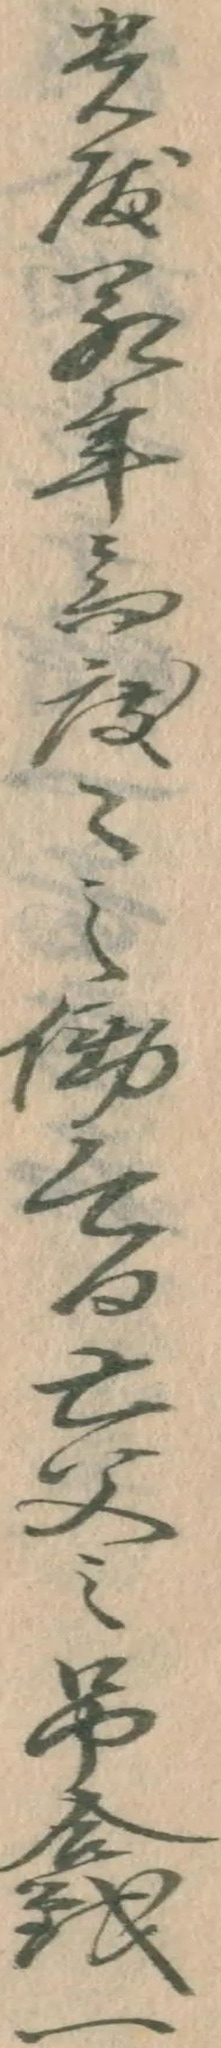貴殿若年に而度々之働今日亡父之弔合戦一
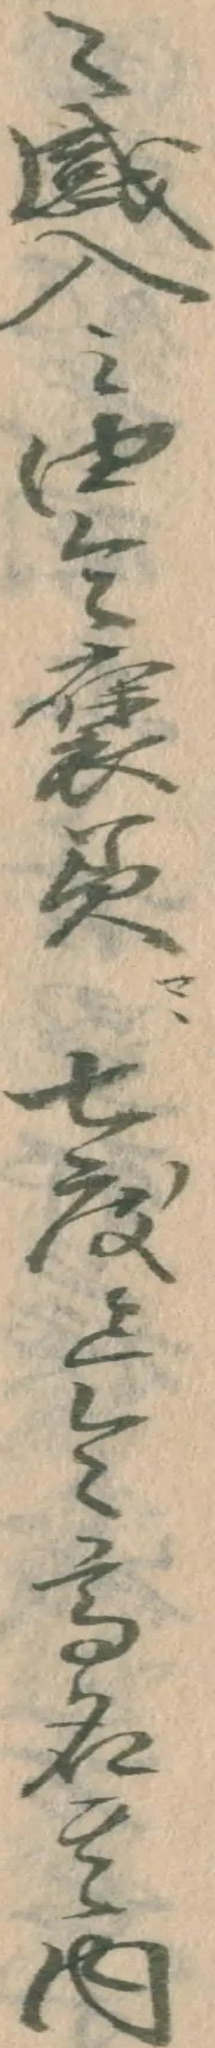々感入之由令褒美七度迄令高名其内
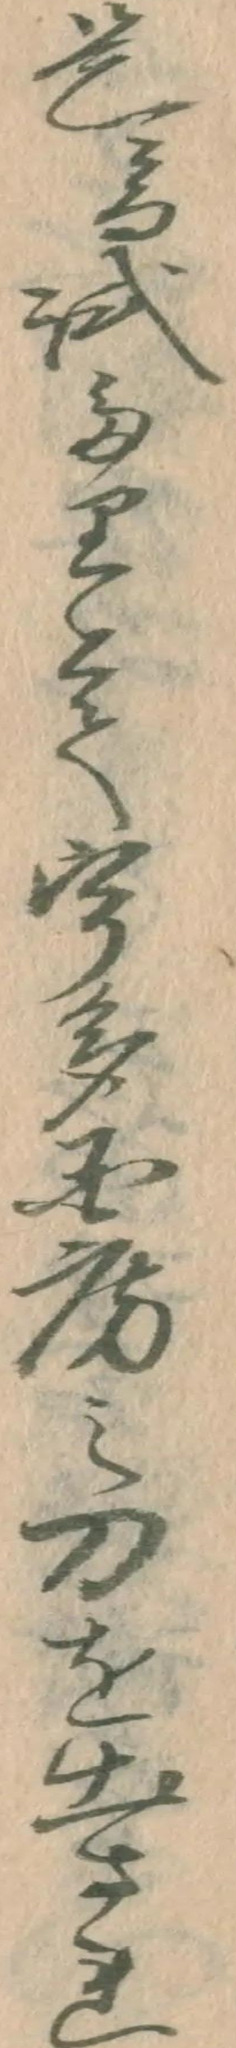是に而試多里とて宇多国房之刀を出さ連

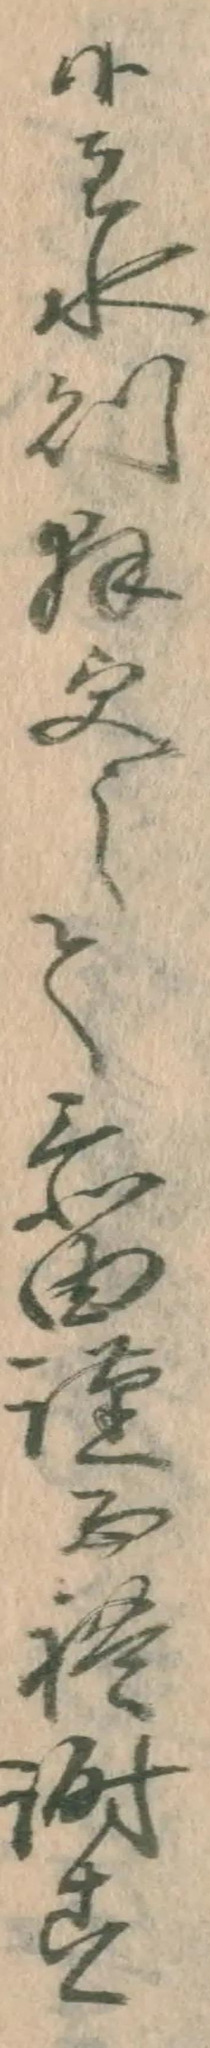候主水拝受して忝由金謹而禮謝春
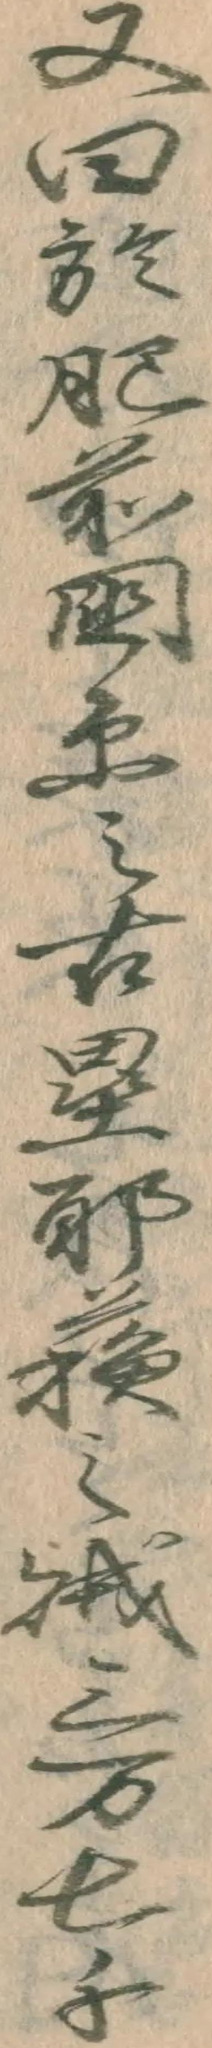又曰於肥前国原之古塁耶蘇之賊三万七千
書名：切支丹御退治記 49巻. [8]
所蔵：国立国会図書館 National Diet Library, JAPAN
